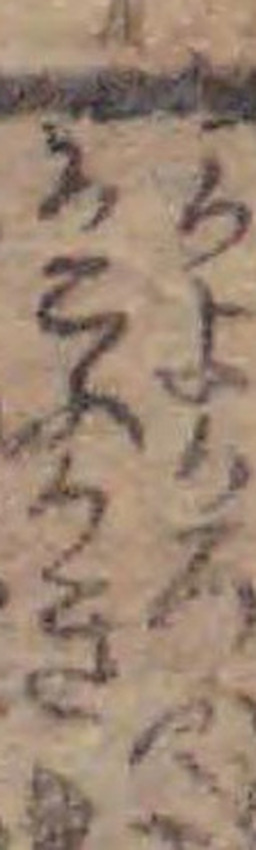かこふかき
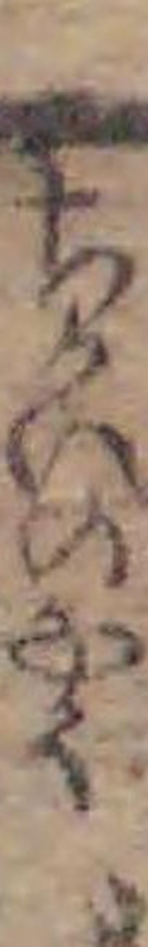ちかいのやう
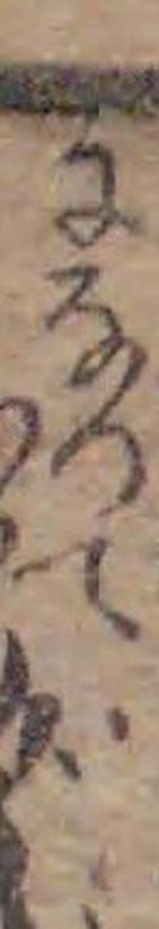になつて

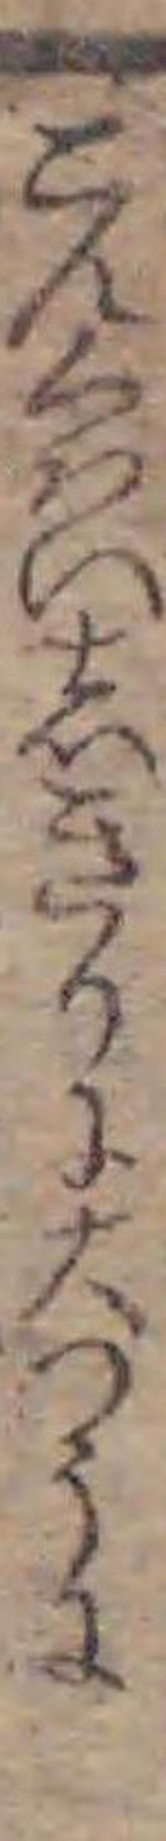こんくはいしきりに大つうに
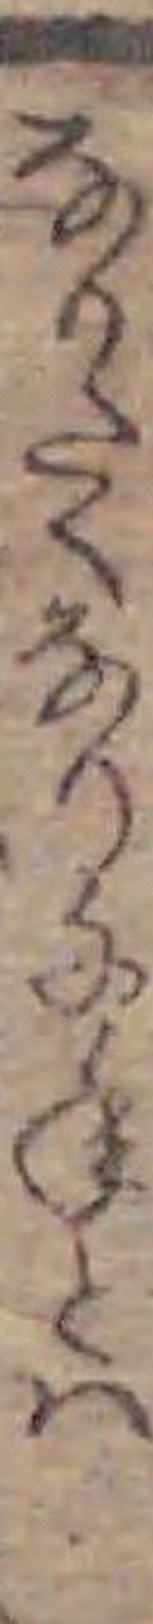なりたくなり千手とは
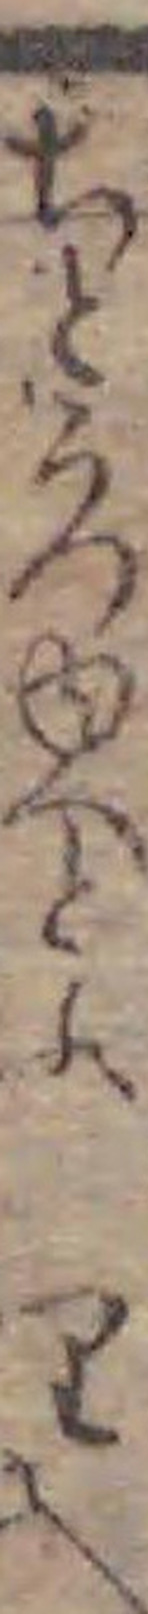ちとうつゆへとふり
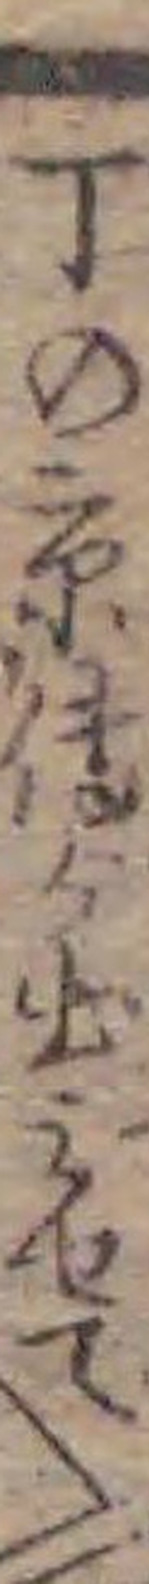丁の京伝か出みせて
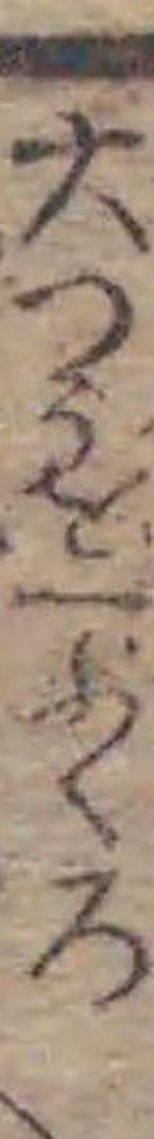大つうを一ふくろ
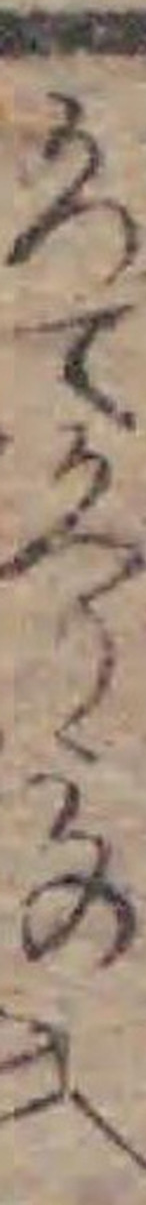かつてかへりしみの
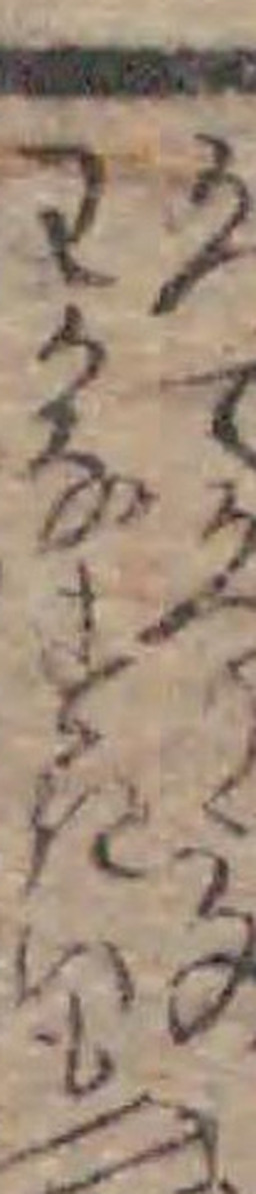わかなすきいも
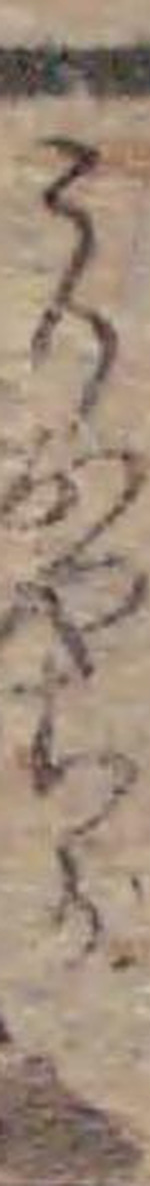うりおやちか
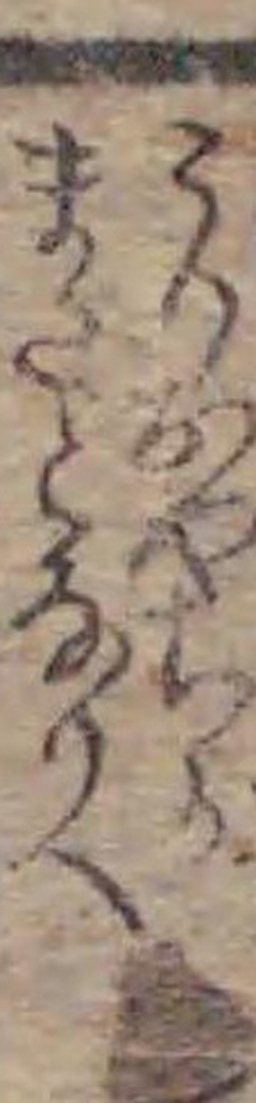またとなりへ
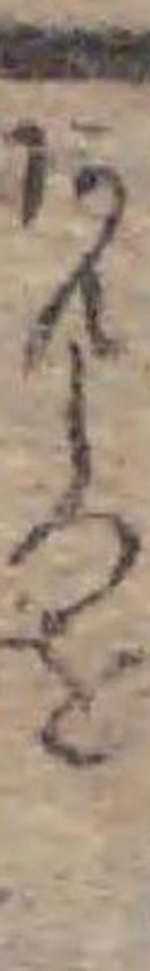あんしつを
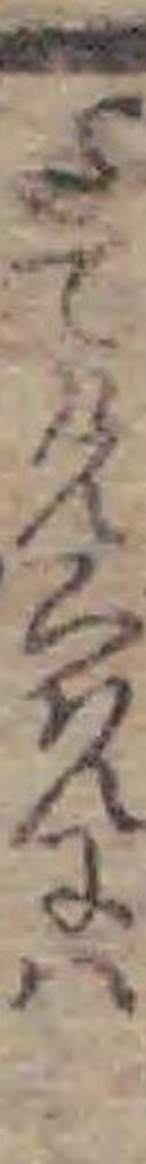たてけんくはんには
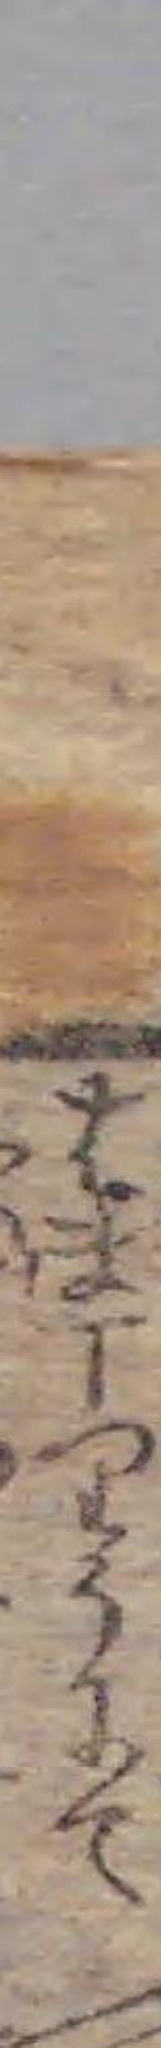はま丁りうにて
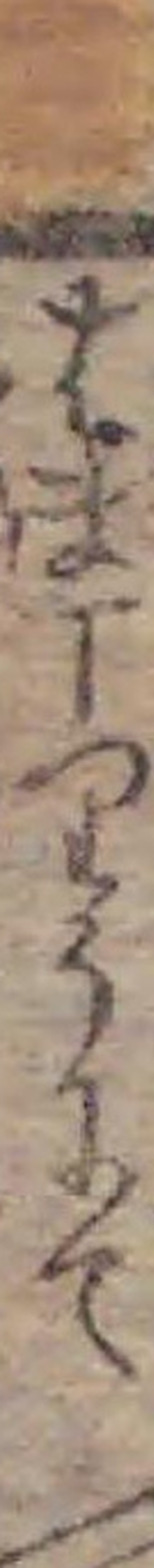はま丁りうにて
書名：化物楽屋異牒 : 2巻
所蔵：国立国会図書館 National Diet Library, JAPAN
